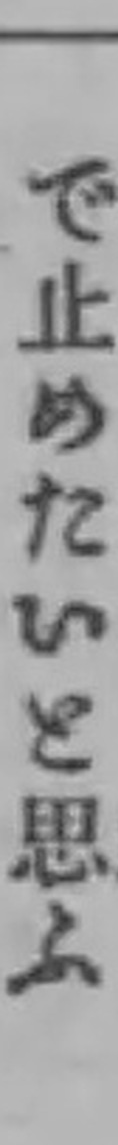で止めたいと思ふ
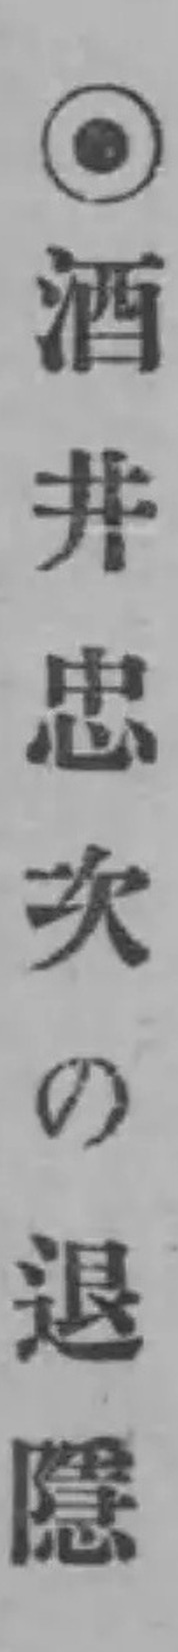⦿酒井忠次の退隠
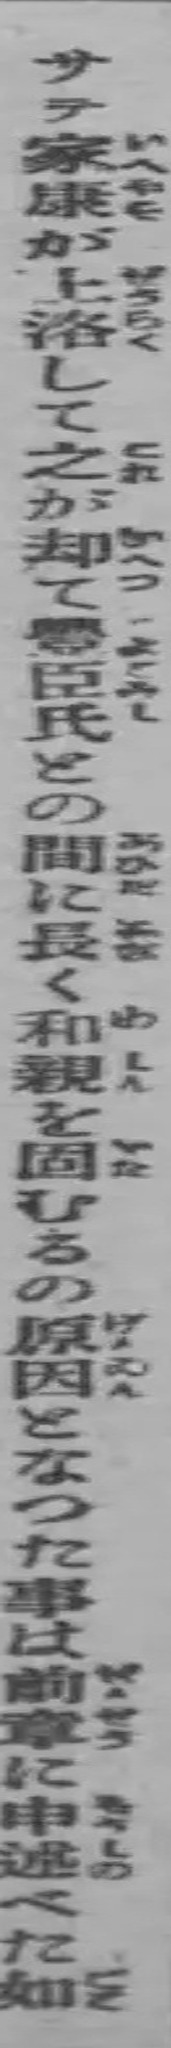サテ家康が上洛して之が却て豊臣氏との間に長く和親を固むるの原因となつた事は前章に申述べた如
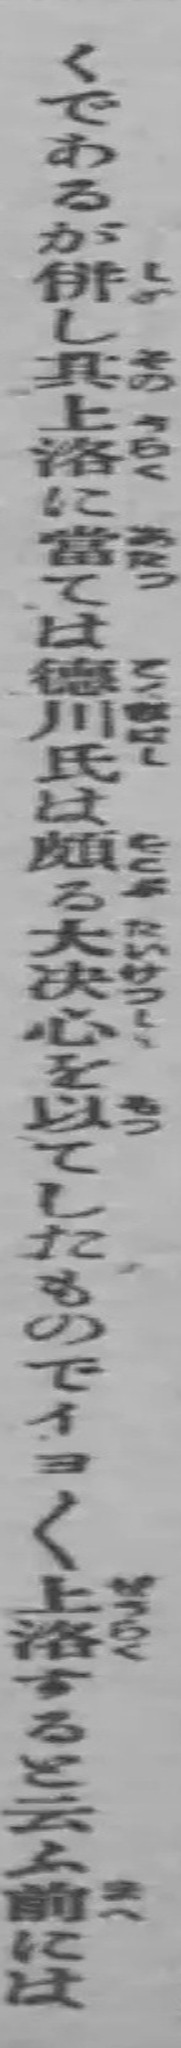くであるが併し其上洛に当ては徳川氏は頗る大決心を以てしたものでイヨ〳〵上洛すると云ふ前には
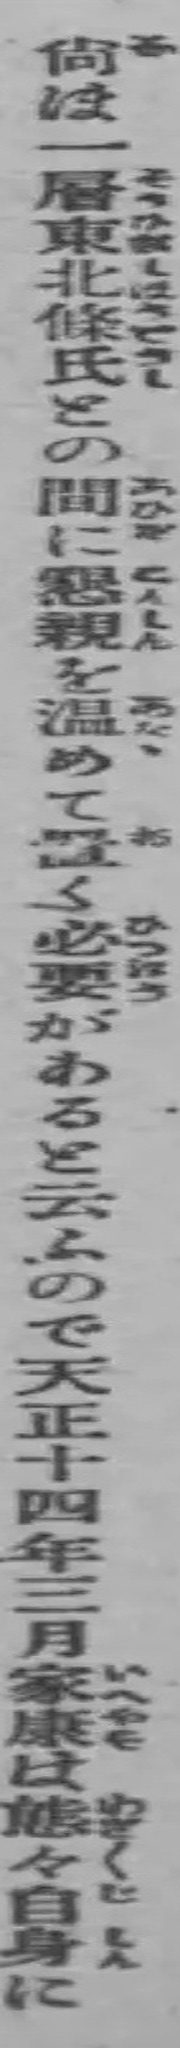尚ほ一層東北條氏との間に懇親を温めて置く必要があると云ふので天正十四年三月家康は態々自身に
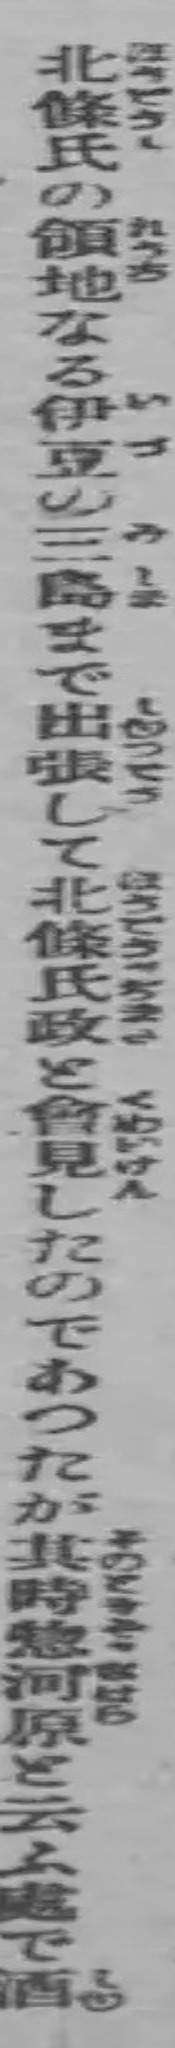惣河原の宴北條氏の領地なる伊豆の三島まで出張して北條氏政と会見したのであつたが其時惣河原と云ふ処で酒
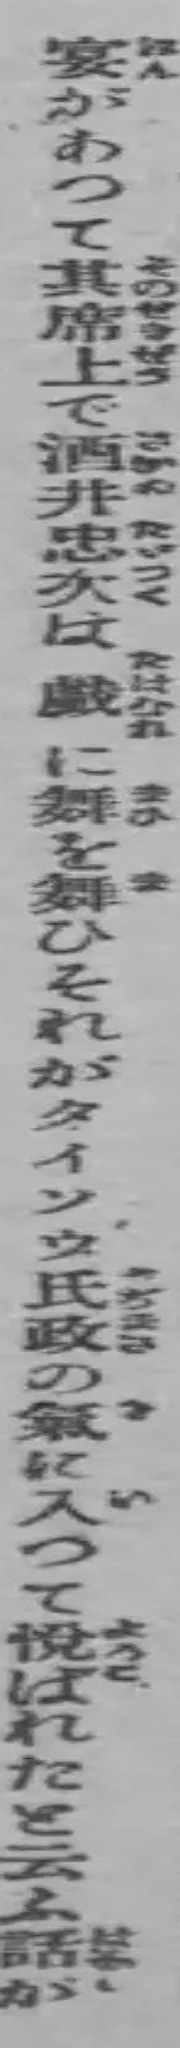宴があつて其席上で酒井忠次は戯に舞を舞ひそれがタイソウ氏政の気に入つて悦ばれたと云ふ話が
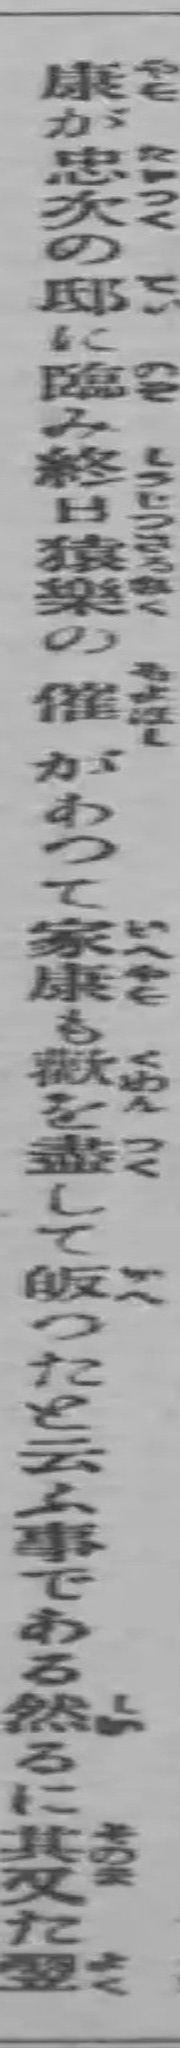見る康が忠次の邸に臨み終日猿楽の催があつて家康も歓を尽して皈つたと云ふ事である然るに其又た翌
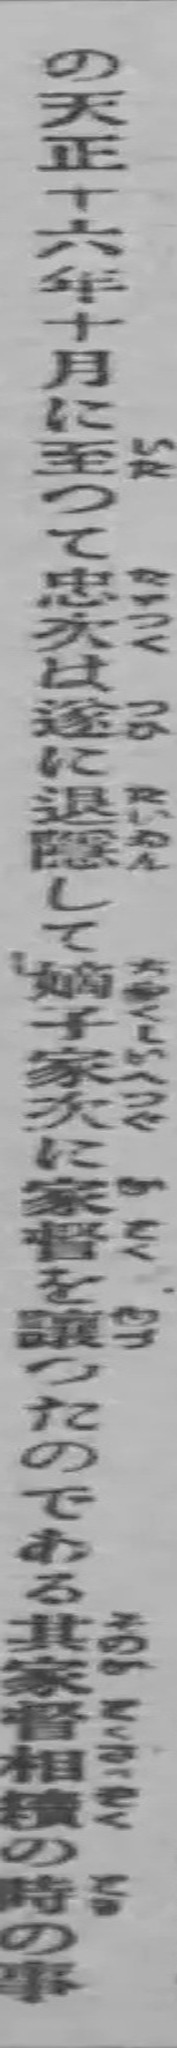忠次退隠の天正十六年十月に至つて忠次は遂に退隠して嫡子家次に家督を譲つたのである其家督相続の時の事
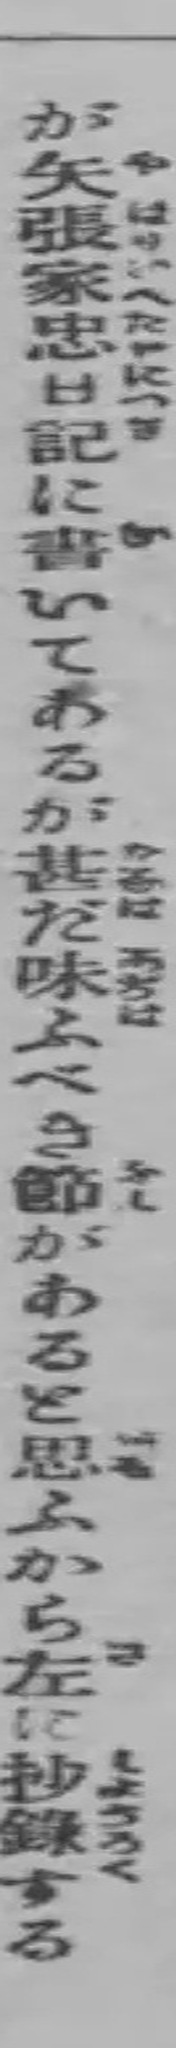が矢張家忠日記に書いてあるが甚だ味ふべき節があると思ふから左に抄録する
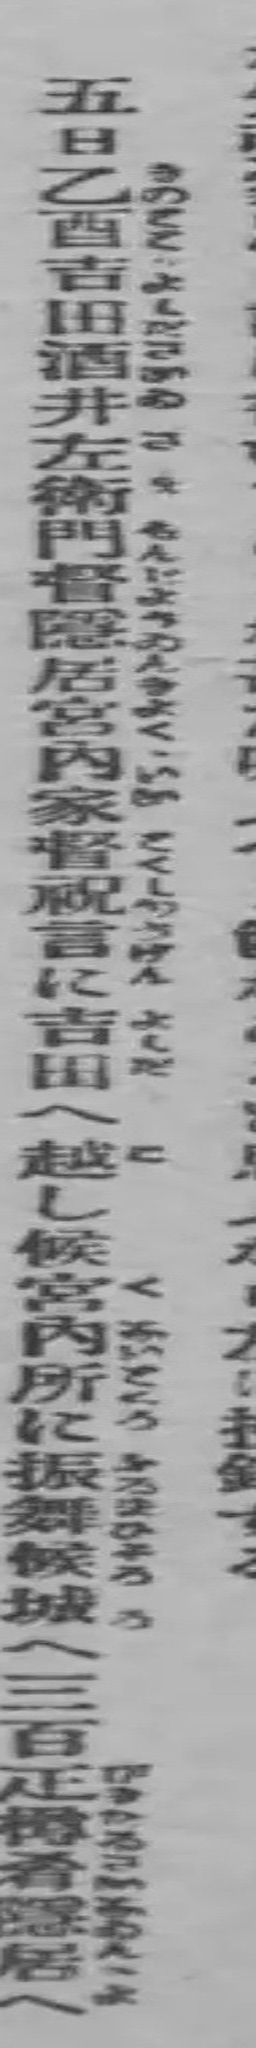五日乙酉吉田酒井左衛門尉隠居宮内家督祝言に吉田へ越し候宮内所に振舞候城へ三百疋樽肴隠居へ
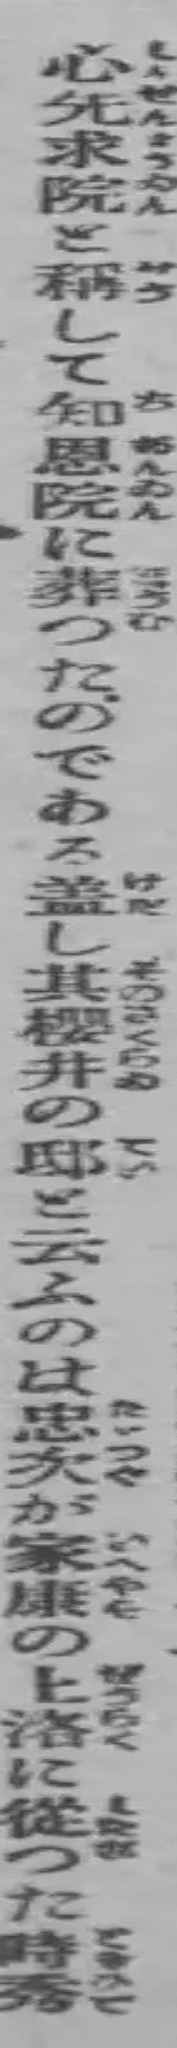心先求院と称して知恩院に葬つたのである蓋し其桜井の邸と云ふのは忠次が家康の上洛に従つた時秀
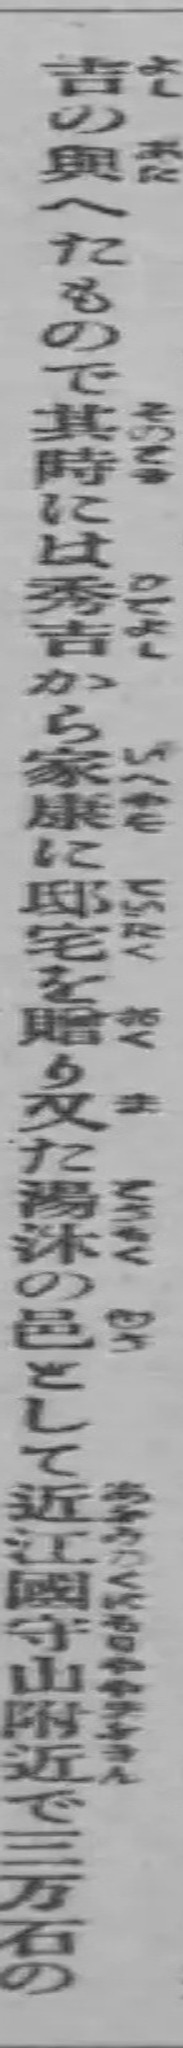吉の与へたもので其時には秀吉から家康に邸宅を贈り又た湯沐の邑として近江国守山附近で三万石の
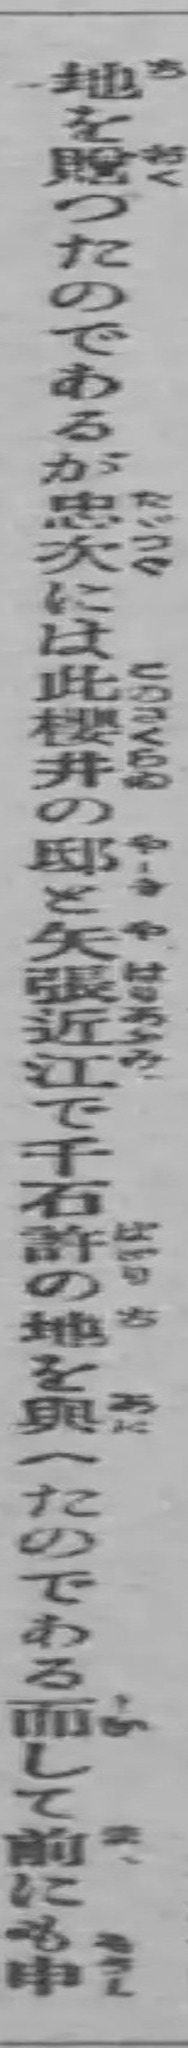地を贈つたのであるが忠次には此桜井の邸と矢張近江で千石許の地を与へたのである而して前にも申
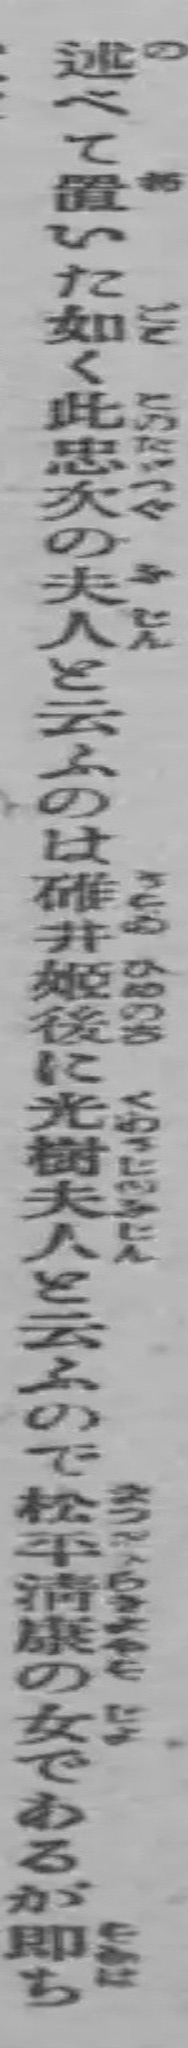述べて置いた如く此忠次の夫人と云ふのは碓井姫後に光樹夫人と云ふので松平清康の女であるが即ち

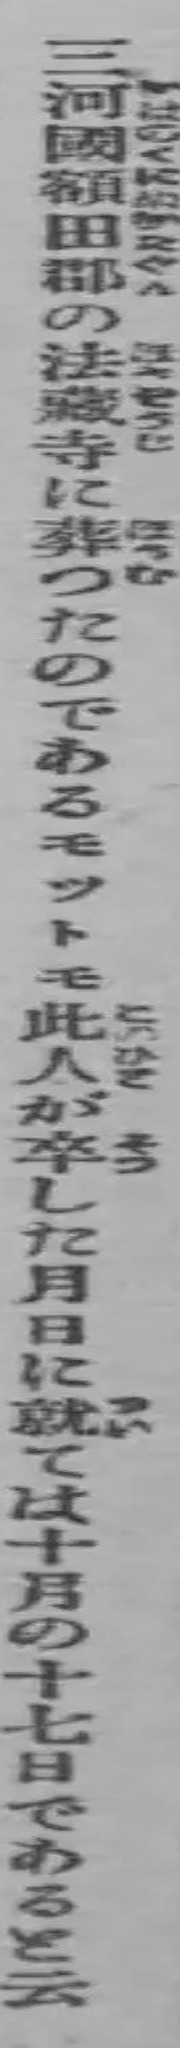三河国額田郡の法蔵寺に葬つたのであるモツトモ此人が卒した月日に就ては十月の十七日であると云
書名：豊橋市史談
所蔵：国立国会図書館 National Diet Library, JAPAN
